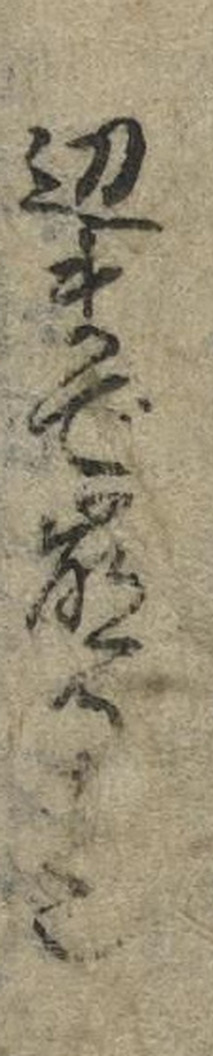辺まで崩る也
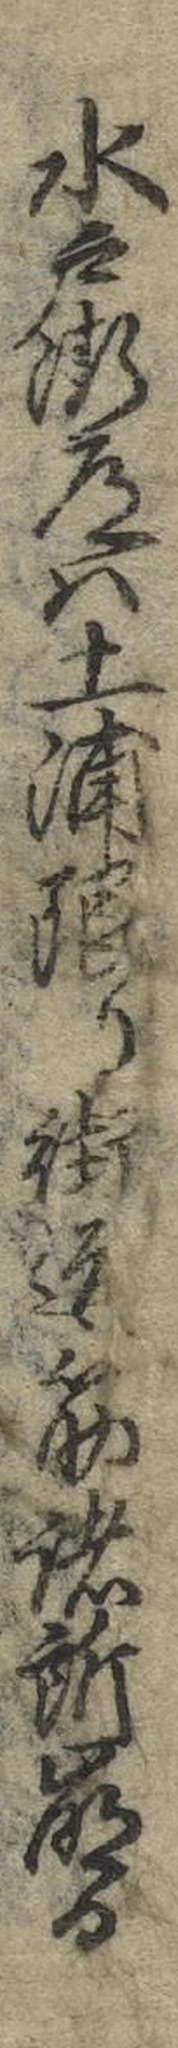水戸街道ハ土浦限り街道筋諸所崩る
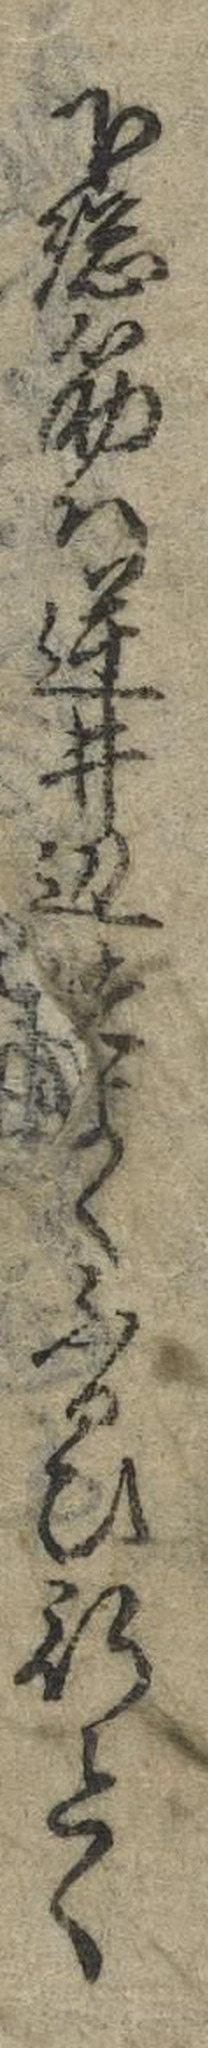下総筋ハ逆井辺つよくふるひ行とく
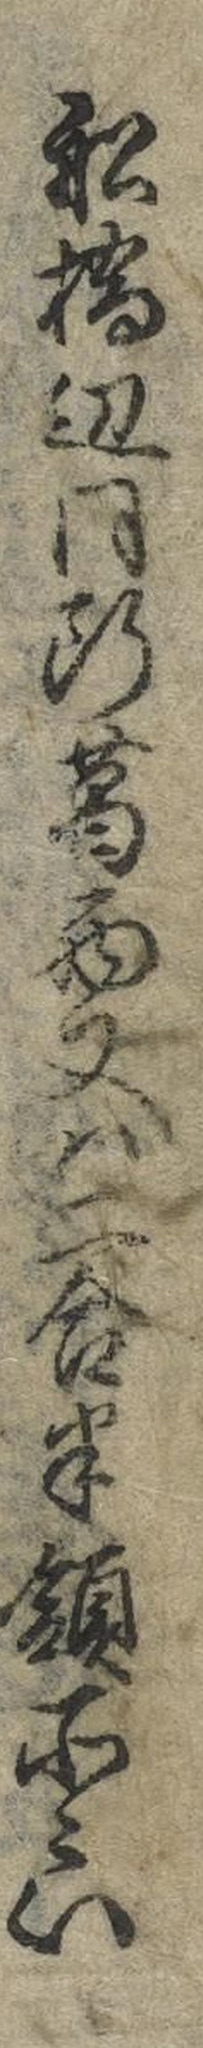船橋辺同断葛西又ハ二合半領所〻ニい
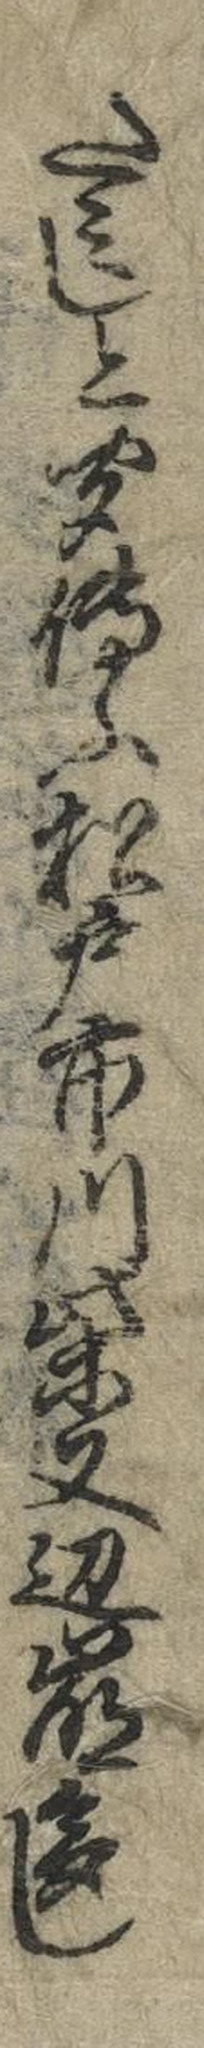たミしと聞伝ふ松戸市川柴又辺崩多し
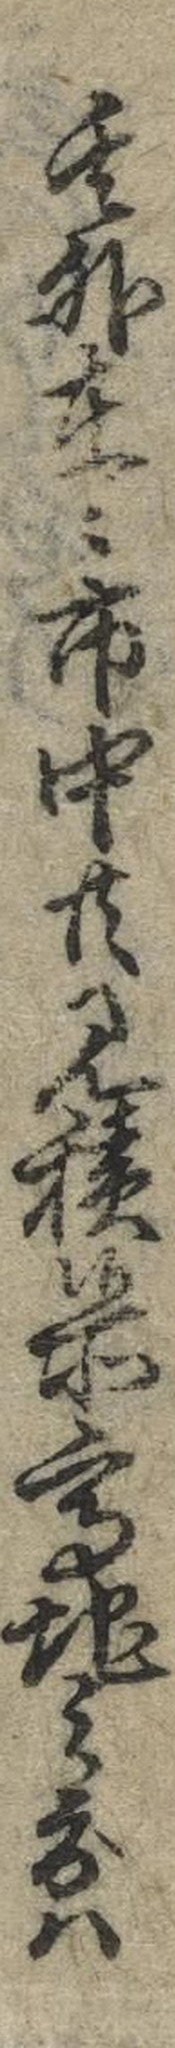其外在〻市中共見積候処高地之方ハ
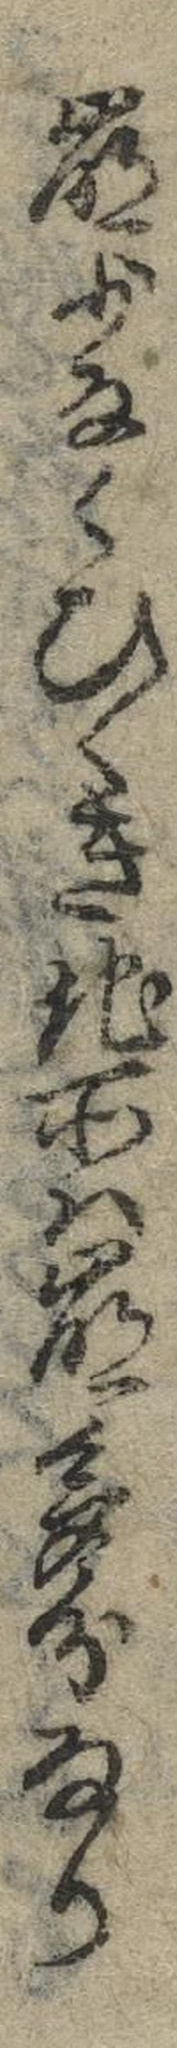崩少なくひくき地所ハ崩多分なり
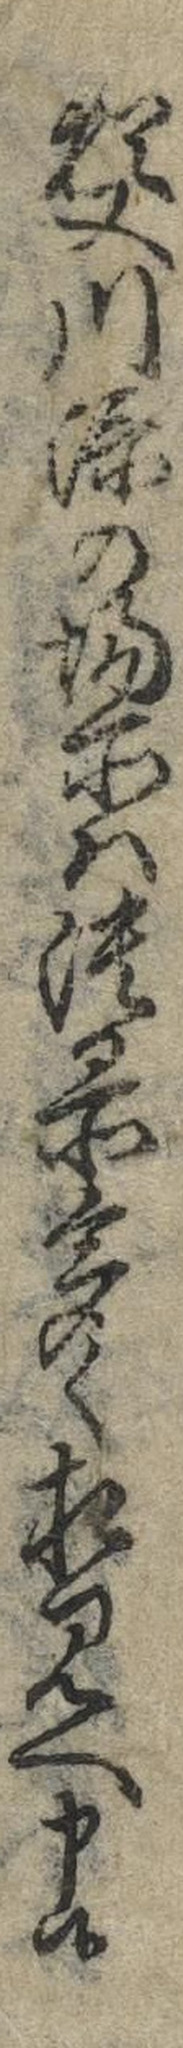猶又川添の場所ハ潰る所多く相見へ申候
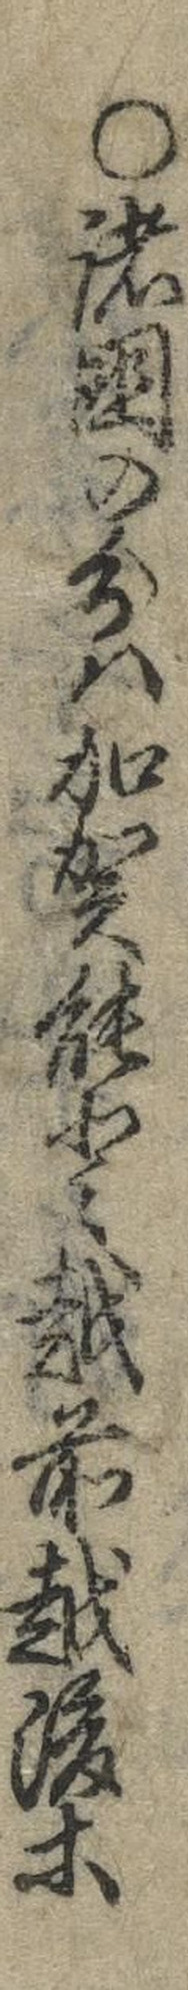〇諸国の分ハ加賀能登越前越後等
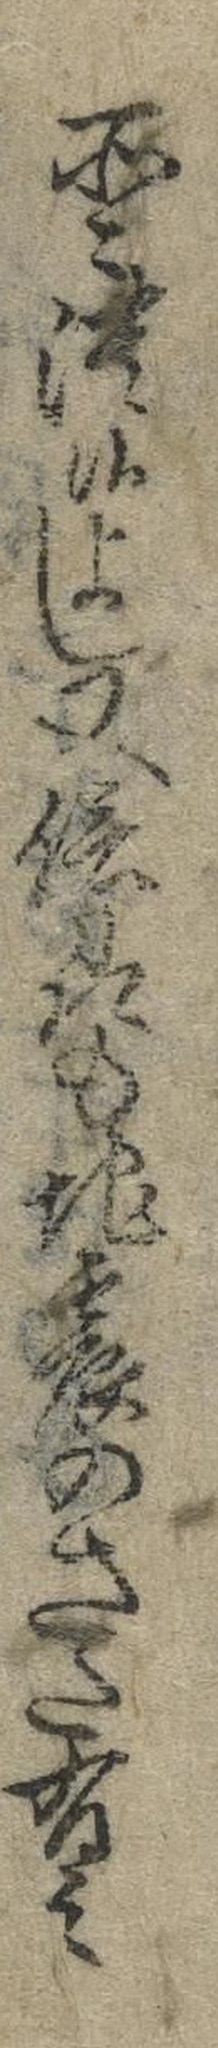所〻潰候よし又信州も地震のさた有之
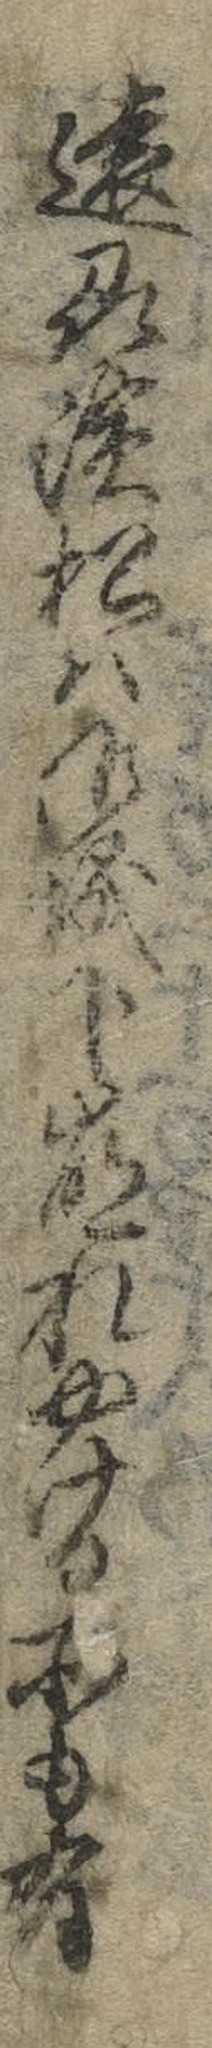遠州濱松ハ御城下崩れやける所も有
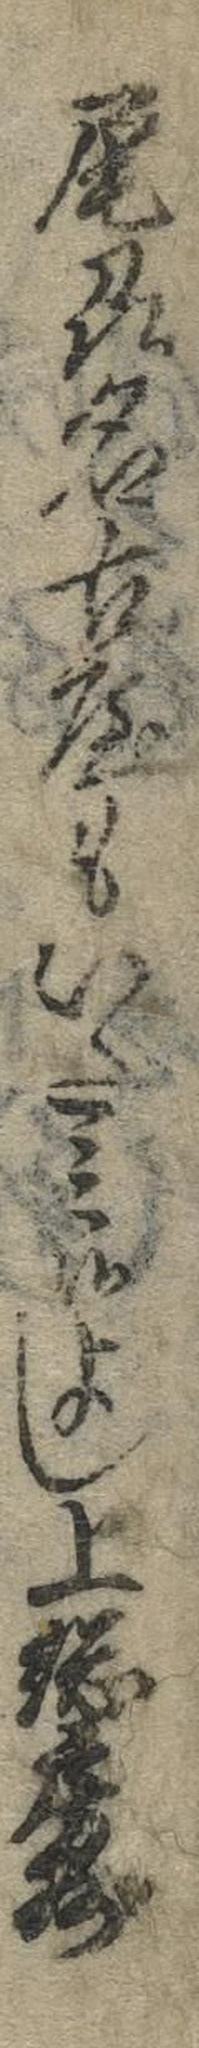尾州名古屋もいたミ候よし上総房州
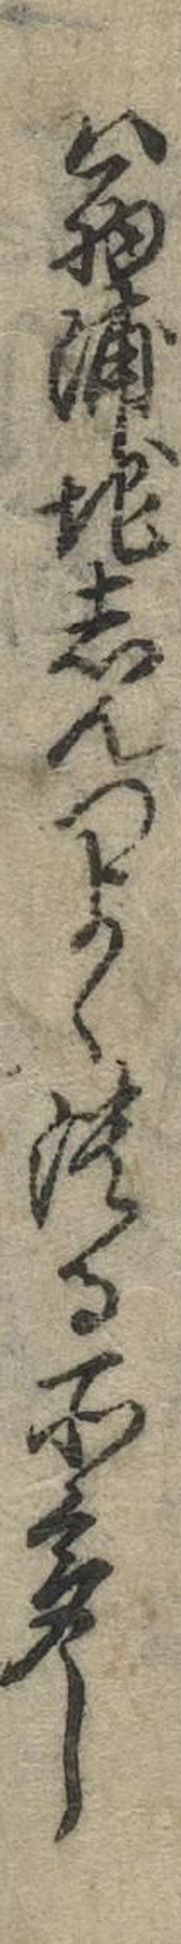ハ西浦地しんつよく潰る所多し
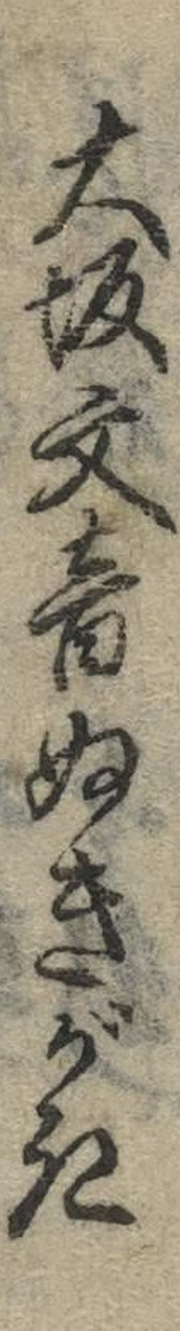大坂文音ぬきがき
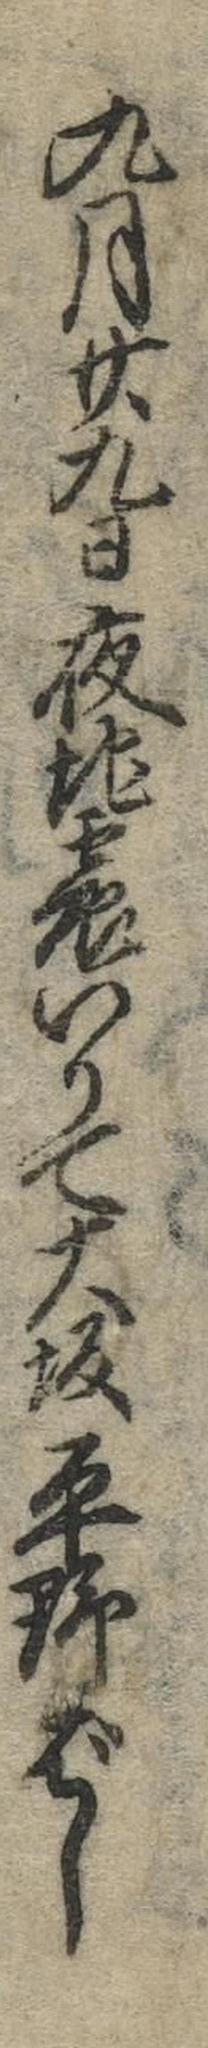九月二廿九日夜地震いりて大坂平野ばし
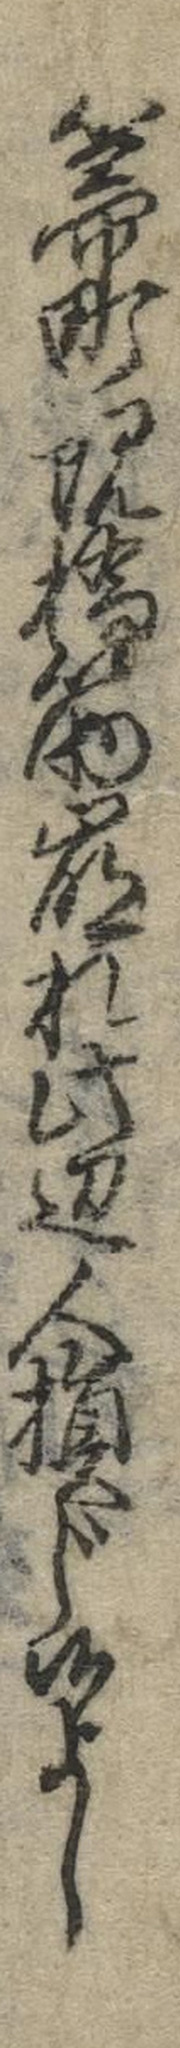箒町蜆橋筋崩れ此辺人損じ候よし
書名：江戸御屋鋪方町方共　地震類焼場所巨細書之寫　潰家潰土蔵共取調附街道筋近在迄
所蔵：東京大学地震研究所図書室 Earthquake Research Institute Library, The University of Tokyo, JAPAN
